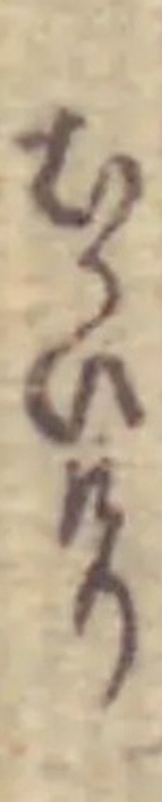むかいけり
